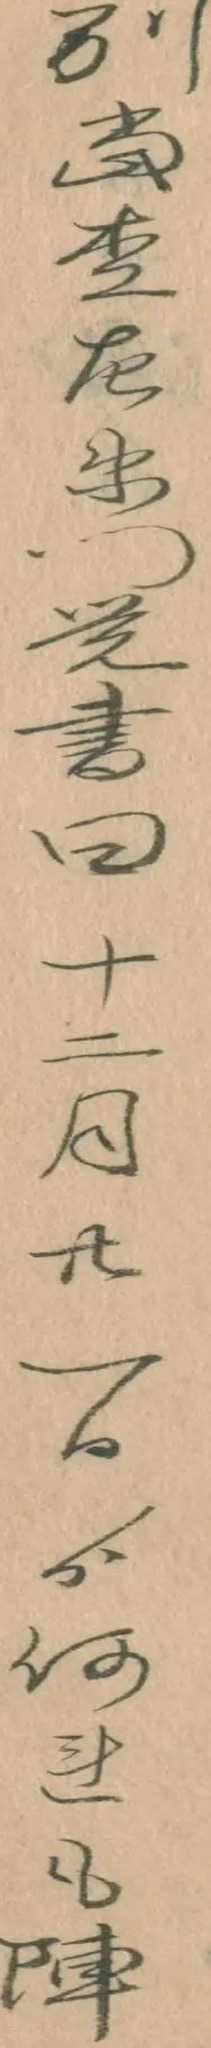別当杢左衛門覚書曰十二月廿一日ゟ何連も陣
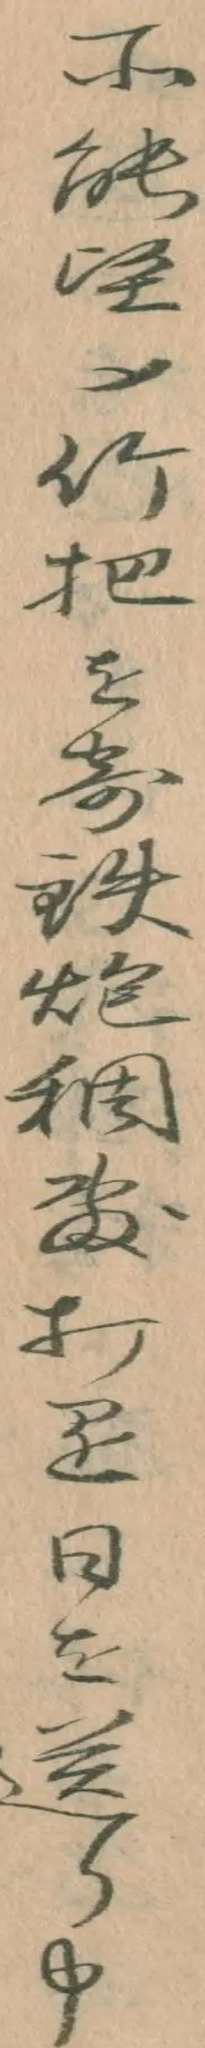所能堅め竹把を寄鉄炮稠敷打懸日を送り申
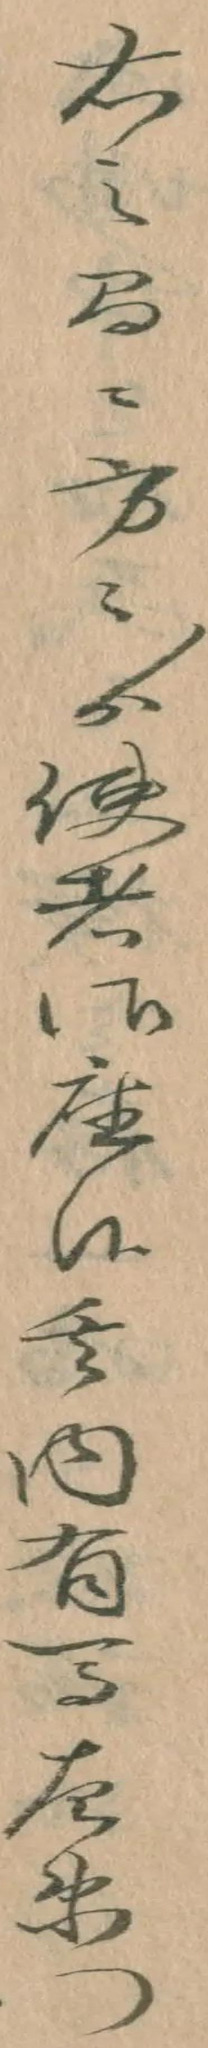右之間に方々ゟ使者御座候其内有馬左衛門
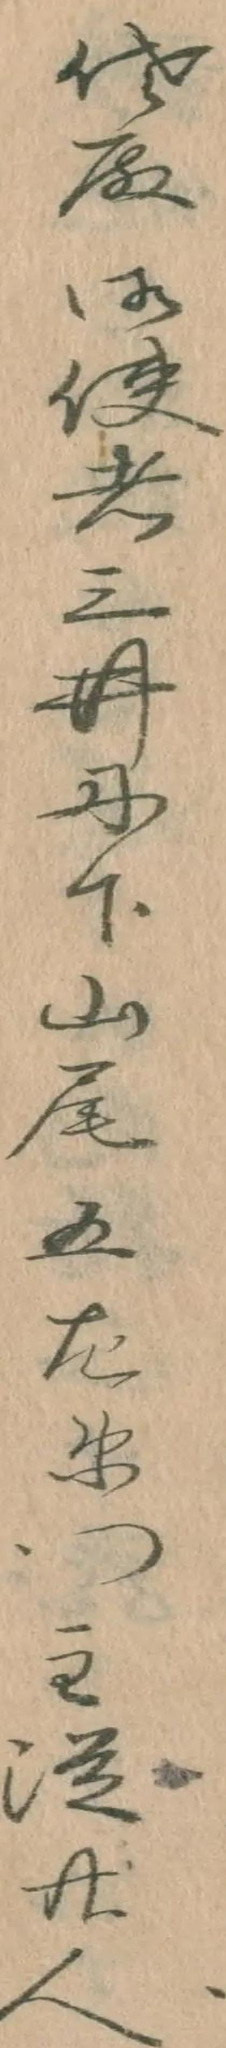佐殿御使者三井丹下山尾五左衛門主従廿人
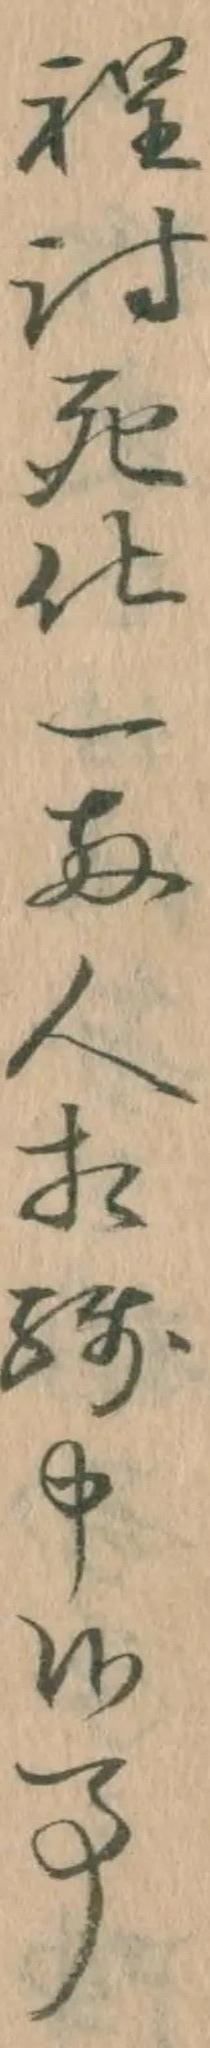程討死仕一両人相残申候事
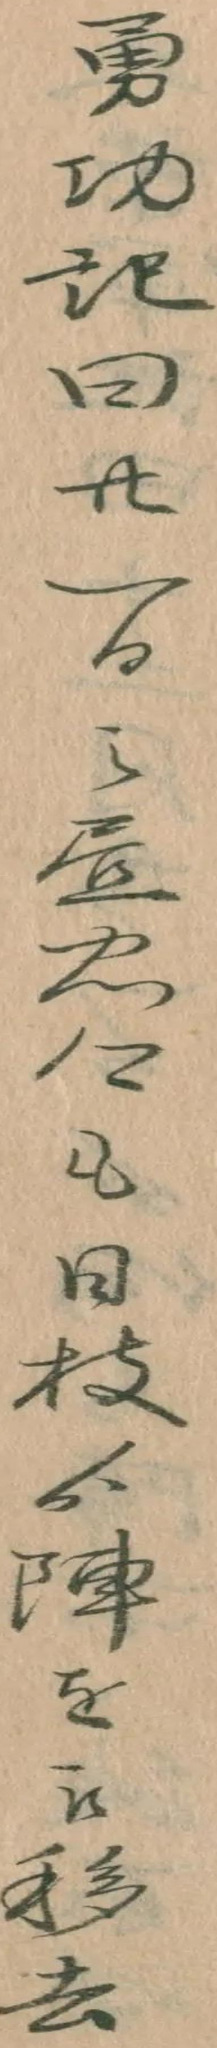勇功記曰廿一日之昼忠郷も日枝ゟ陣を被移去
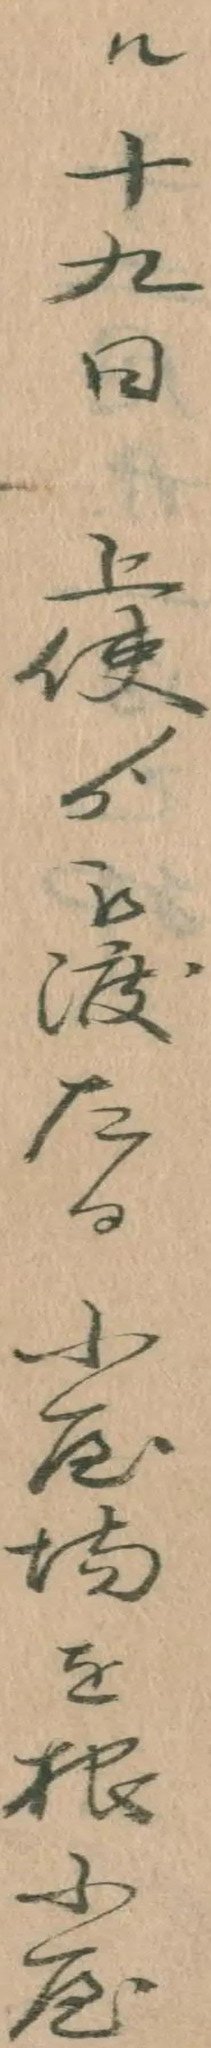候十九日上使ゟ被渡たる小屋場を根小屋
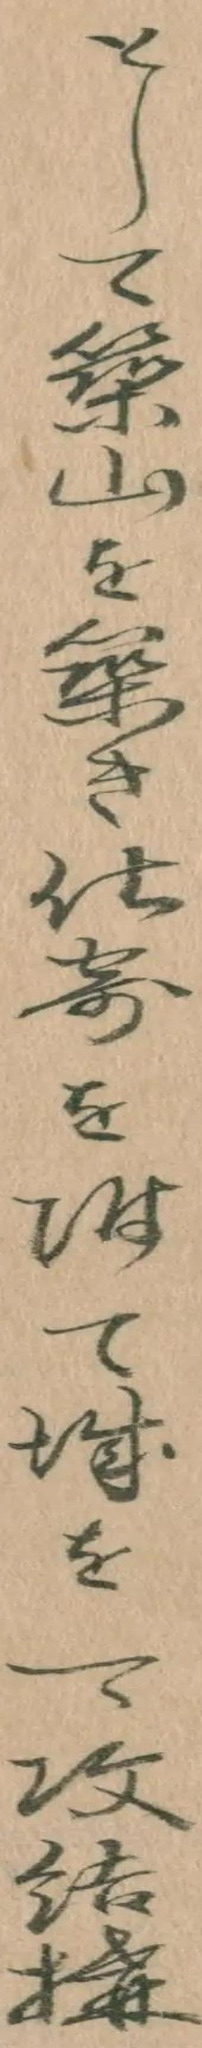として築山を築き仕寄を附て城を可攻結構
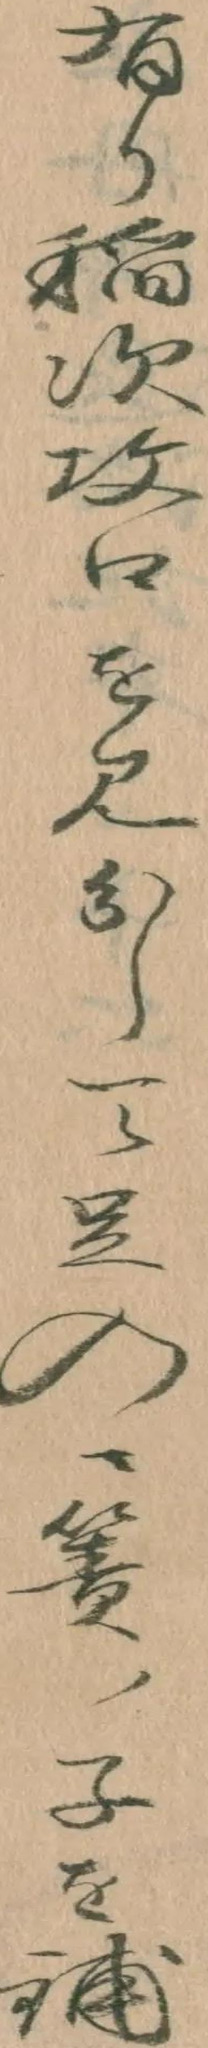有り稲次攻口を見分して足入に箕之子を鋪
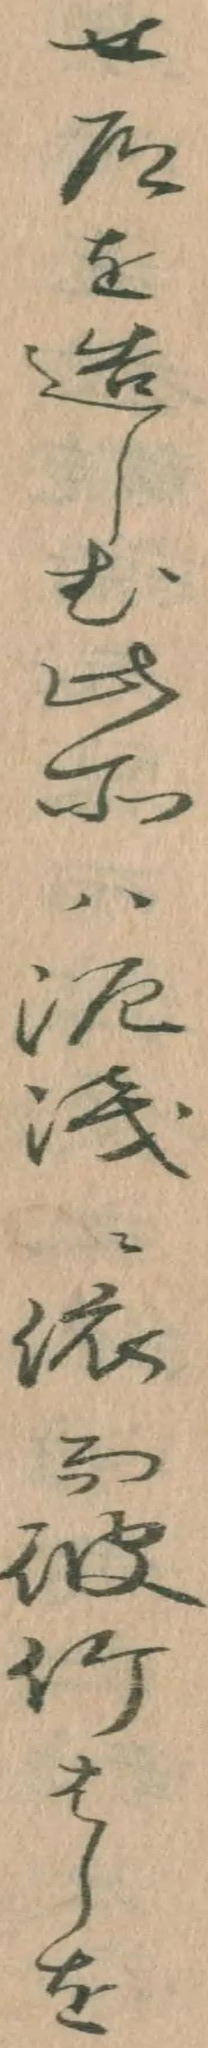せ道を造しむ此所は泥浅に依而彼竹者しを
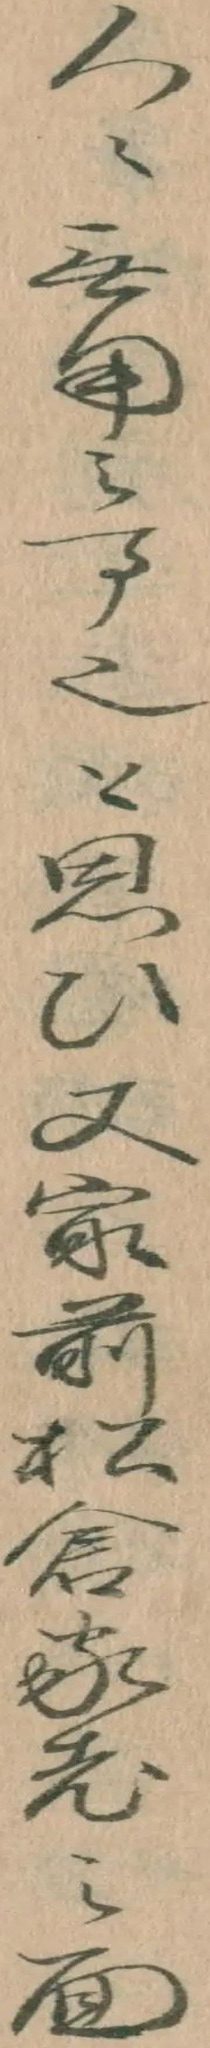人々無用之事也と思ひ又最前松倉家老之面
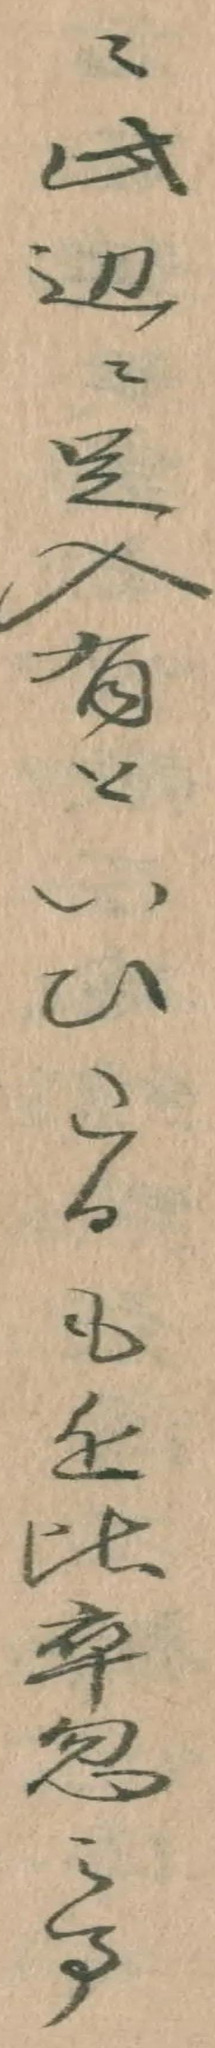々此辺に足入有といひたるも近比卒忽之事
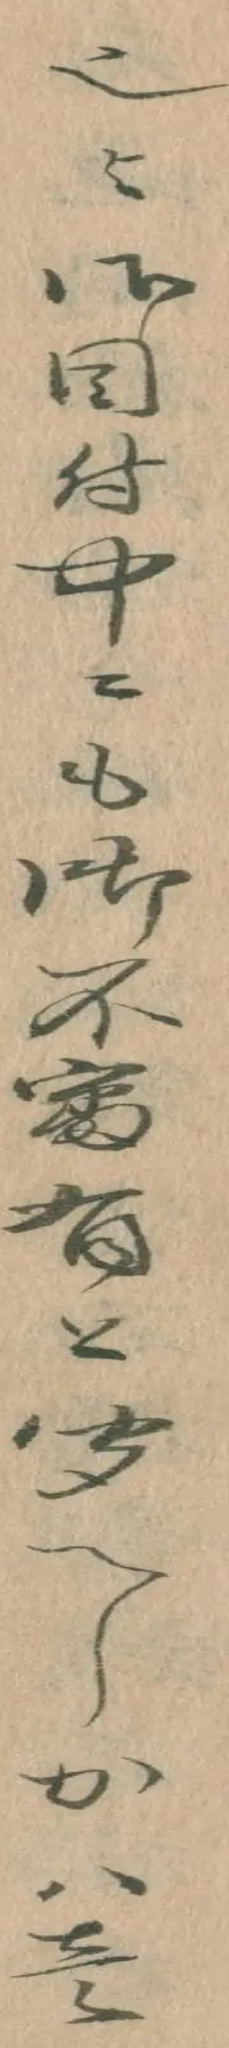也与御目付中にも御不審有と聞へしかは壱
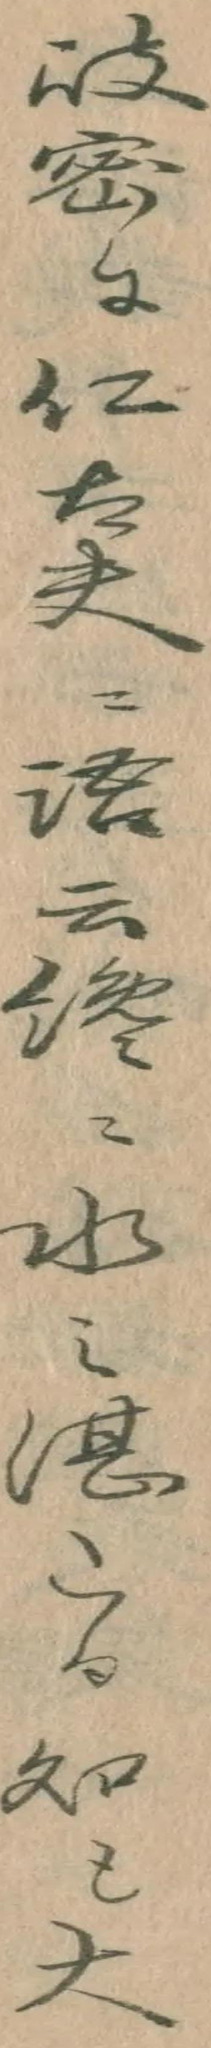彼密尓仁太夫に語云纔に水之湛たる処も大
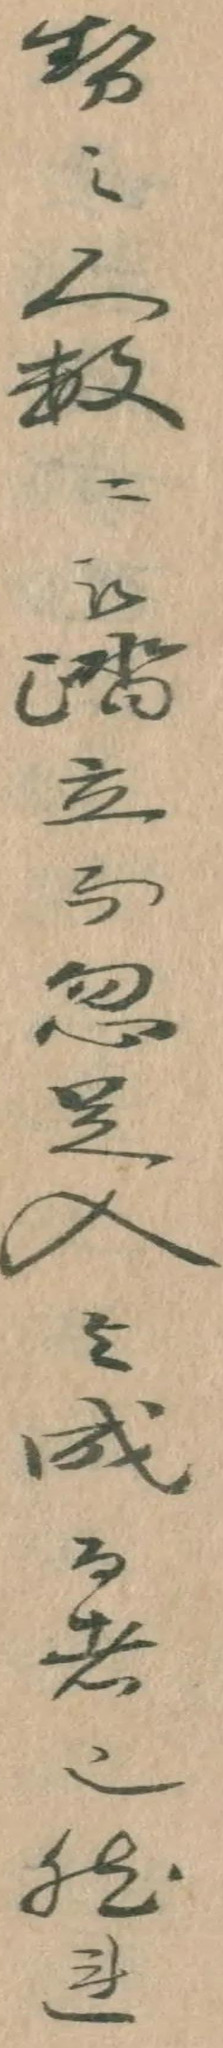勢之人数に被踏立而忽足入与成る者也然連
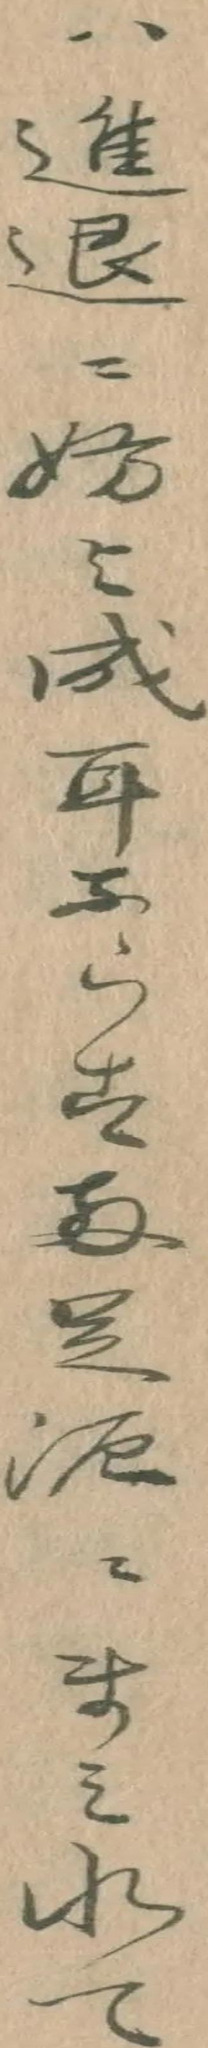は進退に妨与成耳なら春両足泥にまみれて
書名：切支丹御退治記 49巻. [4]
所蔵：国立国会図書館 National Diet Library, JAPAN
